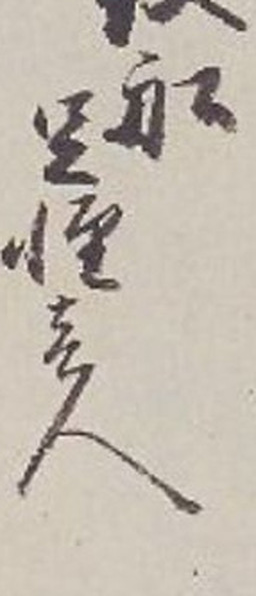足軽壱人
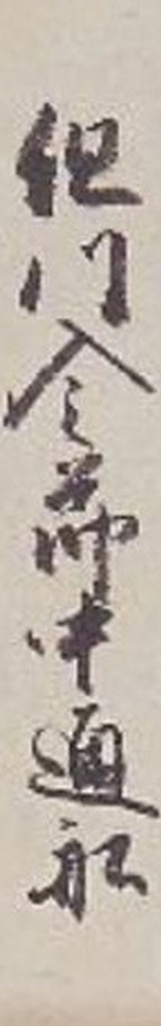但川入之節中通船
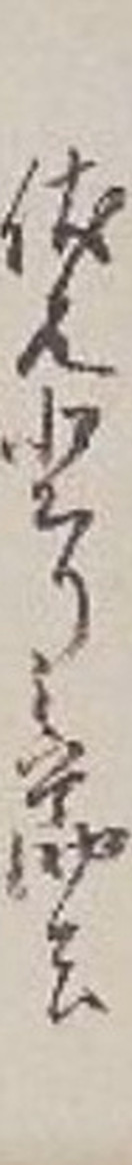伏見登り之節は
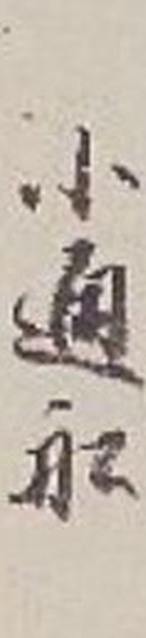小通船

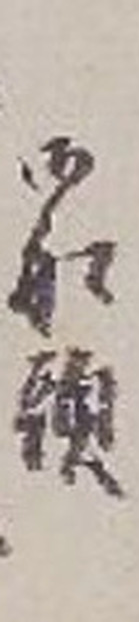御船頭
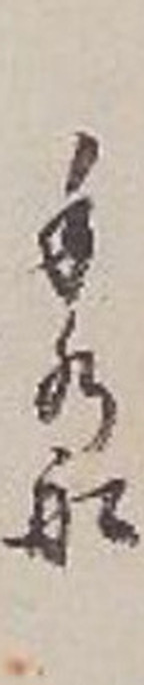手水船
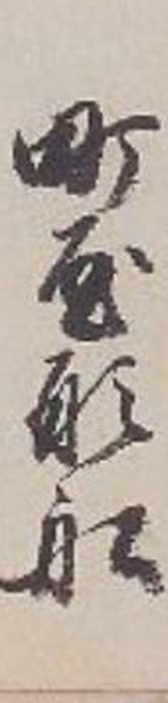町屋形船
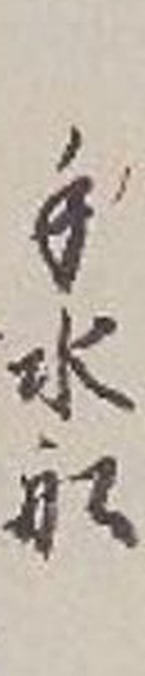手水船
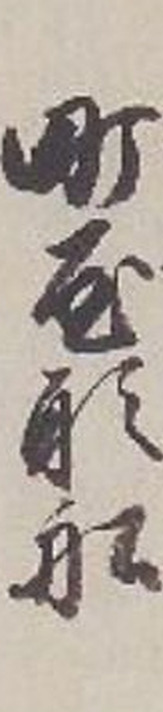町屋形船
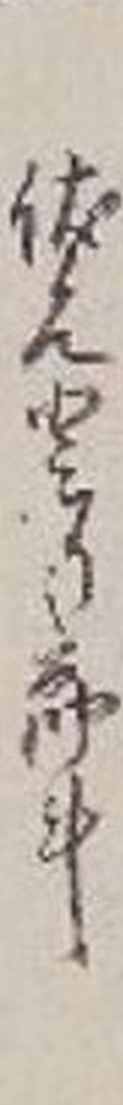伏見登り之節計
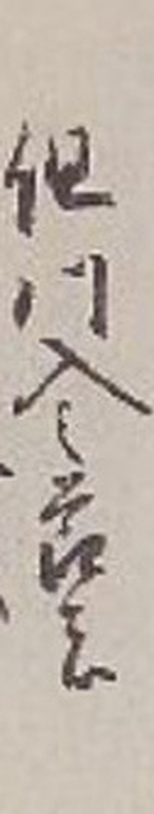但川入之節は〃
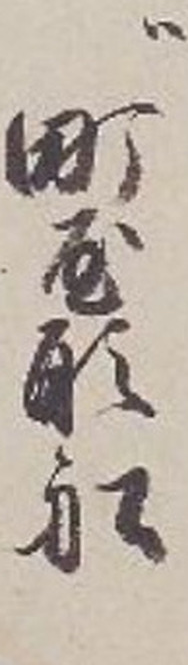町屋形船

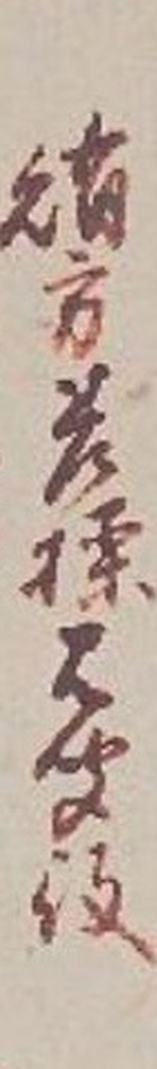賄方差操見聞役
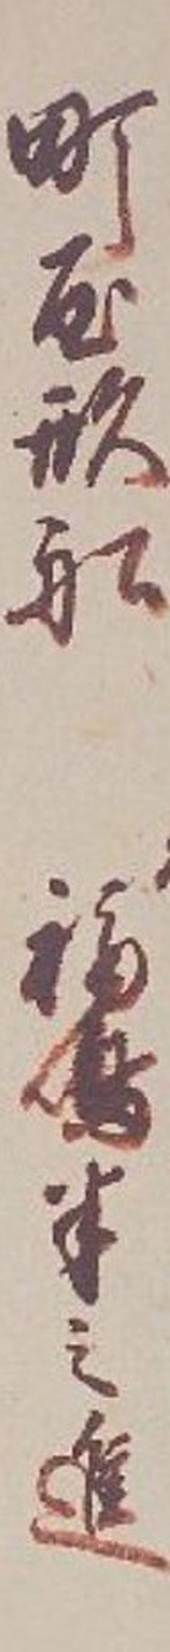町屋形船福嶋半之進
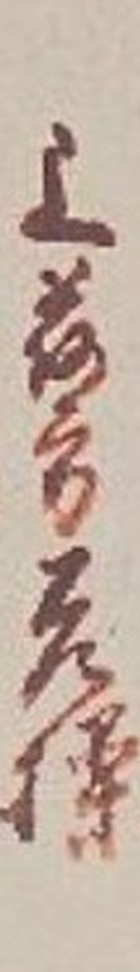上荷方差操
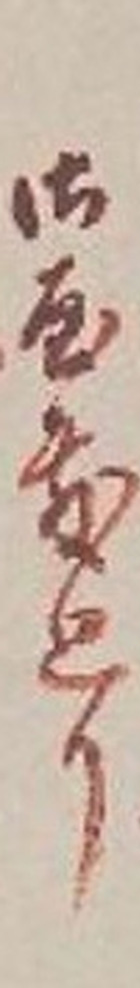御屋敷廻り
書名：琉球人就来府淀川筋船行列帳 但木津川より大阪御屋敷迄並其外一巻
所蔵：University of the Ryukyus Library
